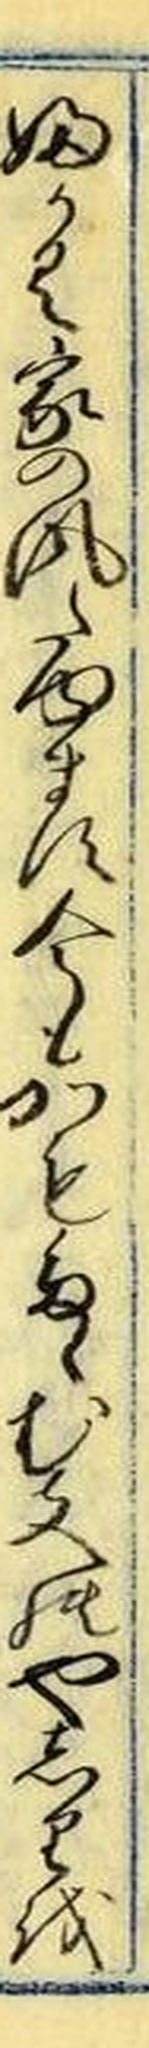ふかく家の風たゆます今もかもたゝむきのやしりを
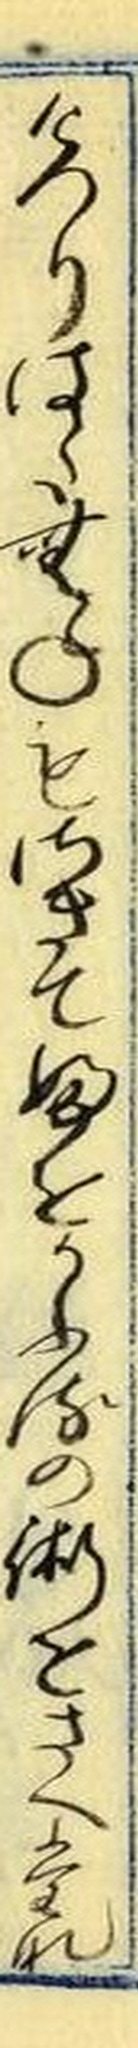けつりはたむねもさきてふをかふる術をさへたな
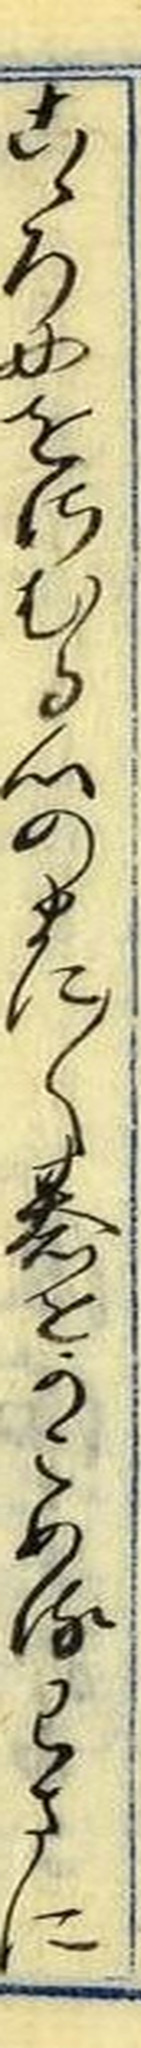こゝろにをさむる心のまに〳〵碁をかこめるわさに
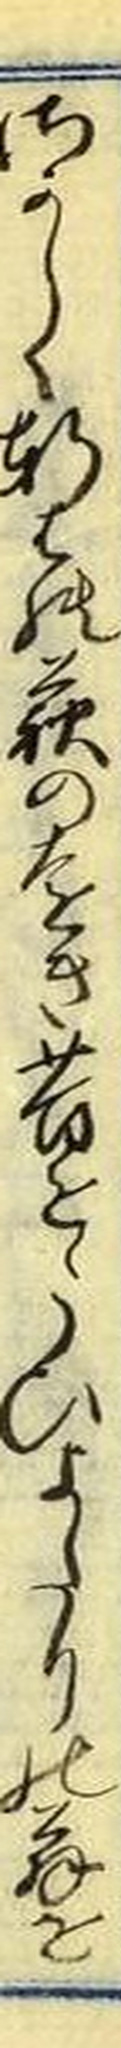さかしく軒はの萩の遠き昔をうひよたりの翁を
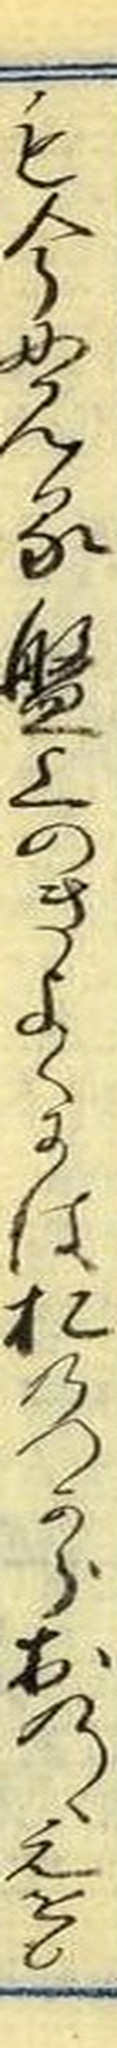も今に見る盤上のきよくにはおのつからおのゝえをも
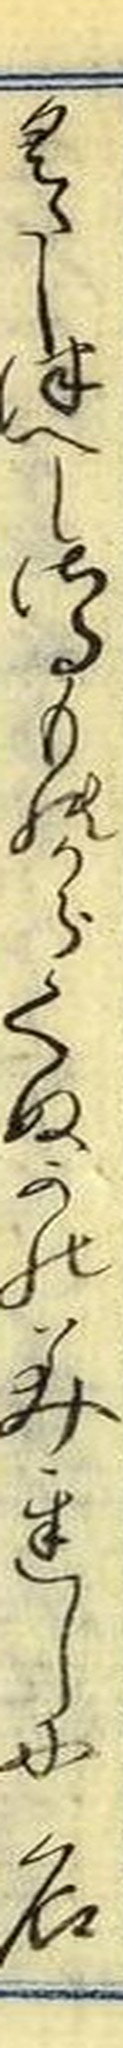くたしつへしさるものからくぬかのみれしに名
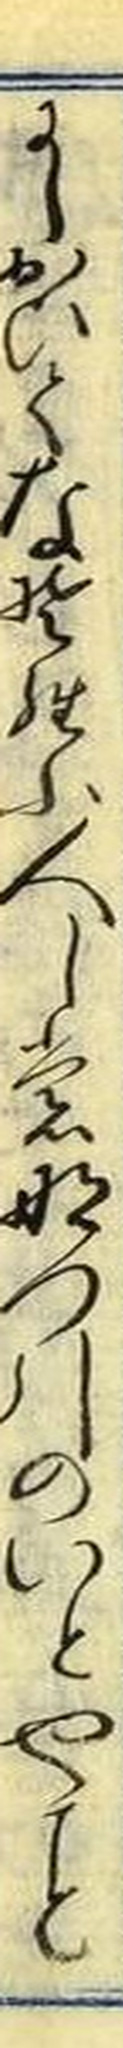にしおひてなそらふ人しもなつ引のいとやこと
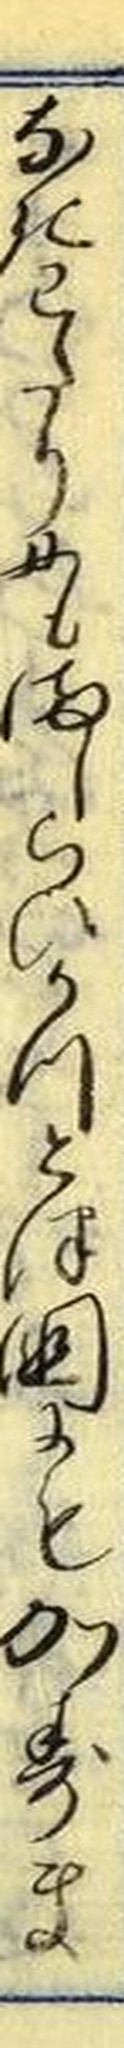なきわたりにもましらひかつとつ国にもかすま
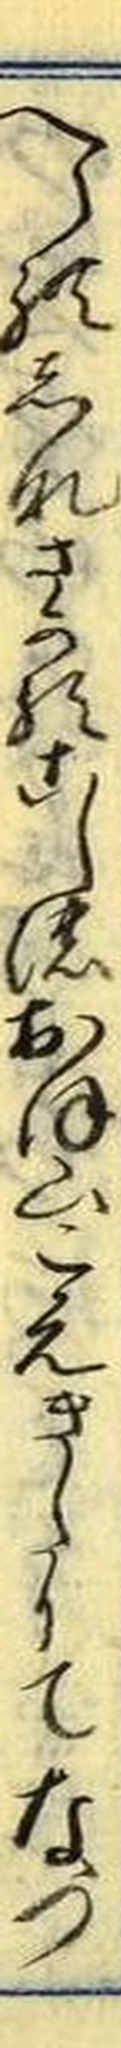へられしなさかるこしのおほ山こえきたりてなつ

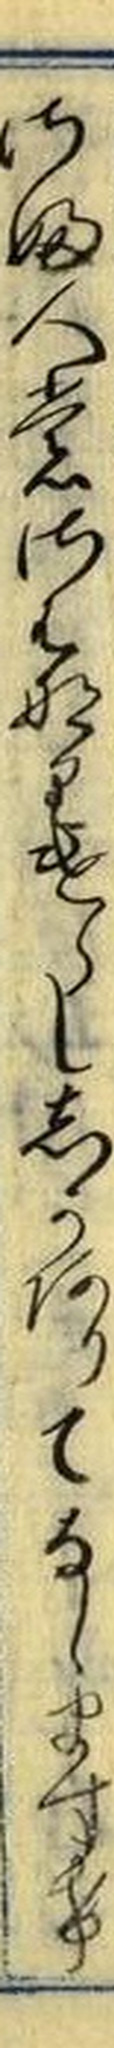さふ人もさはなりけらししかありてなしますけ
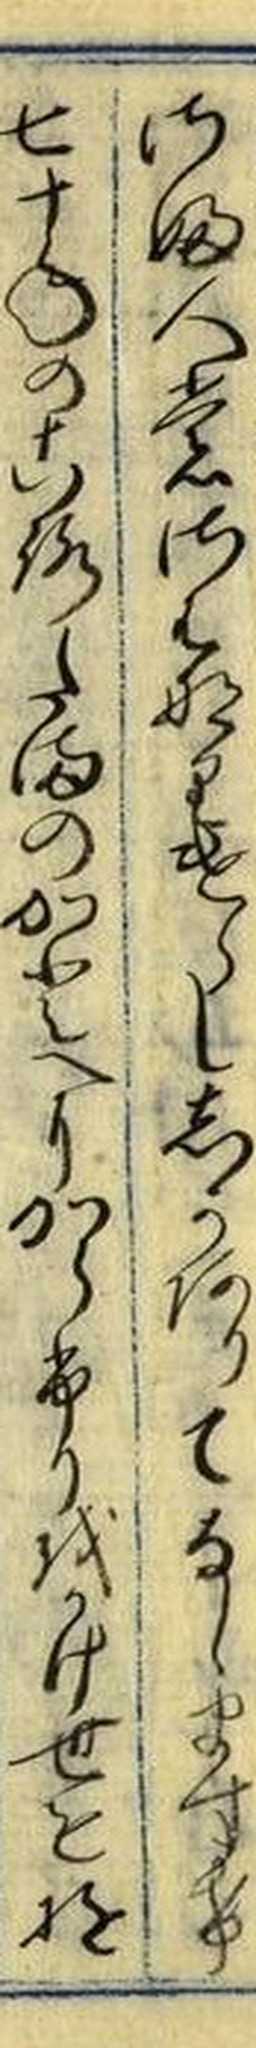七十年のころたまのかとへにからふりをかけ世をゆ
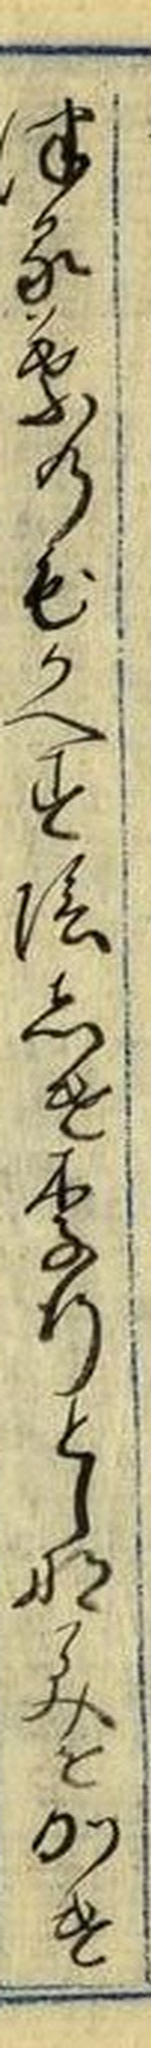つる葉の色もかへす陰しけり行としなみをかけ
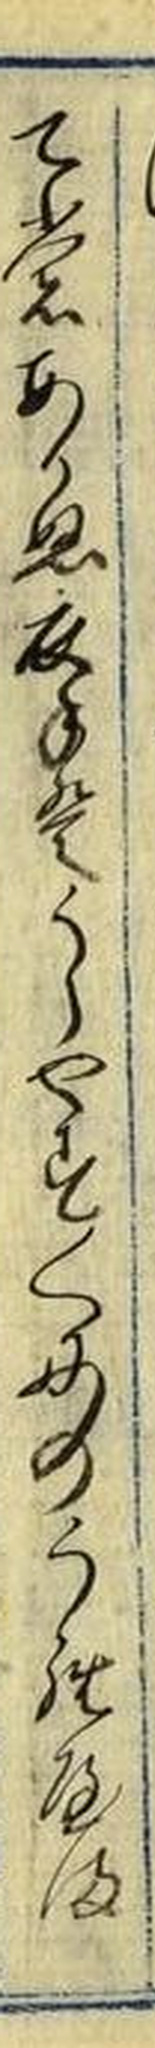てもありぬころ衣手はうらやすくにのうらやま
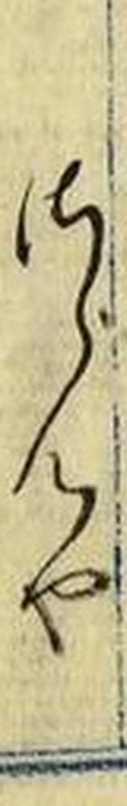さらんや
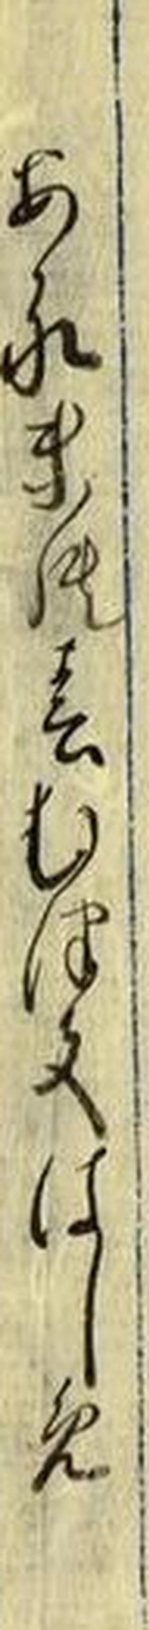安永未の春むつきはしめ
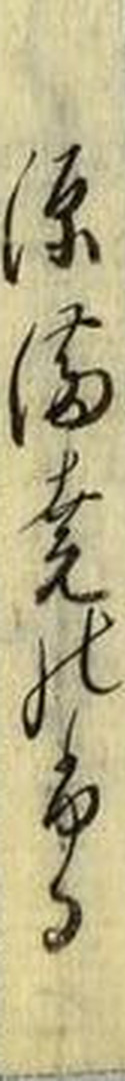源満尭のふる
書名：温古集 三巻
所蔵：福井県文書館 Fukui Prefectural Archives
